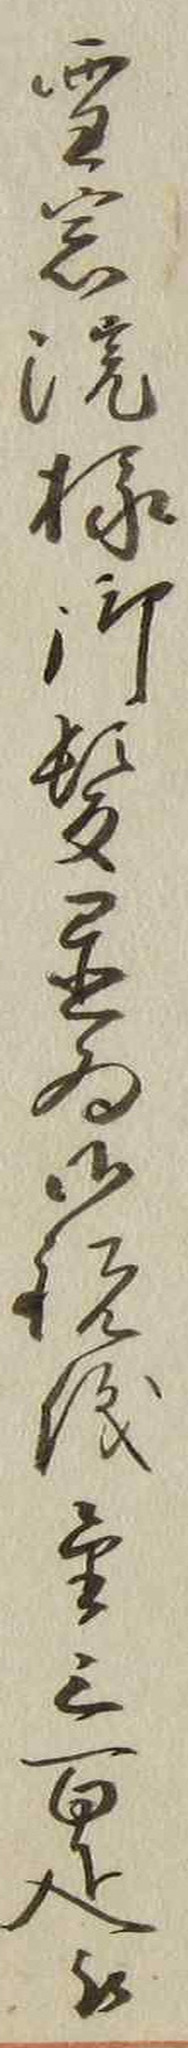雪窓様御髪置為御祝儀金三百疋被
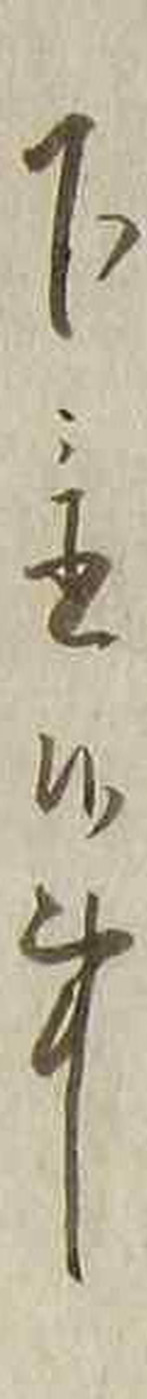下置候事
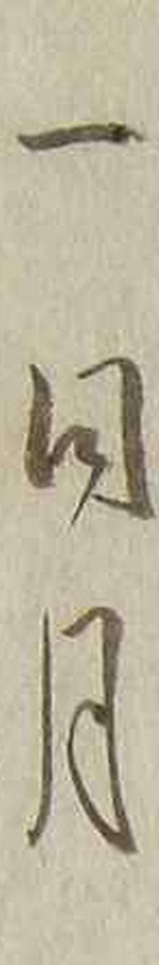一同月
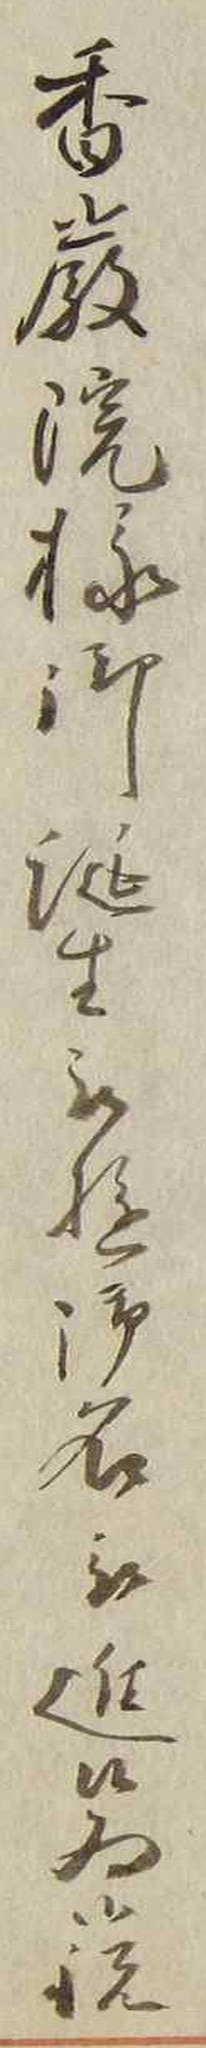香厳院様御誕生被遊御名被進候為御祝

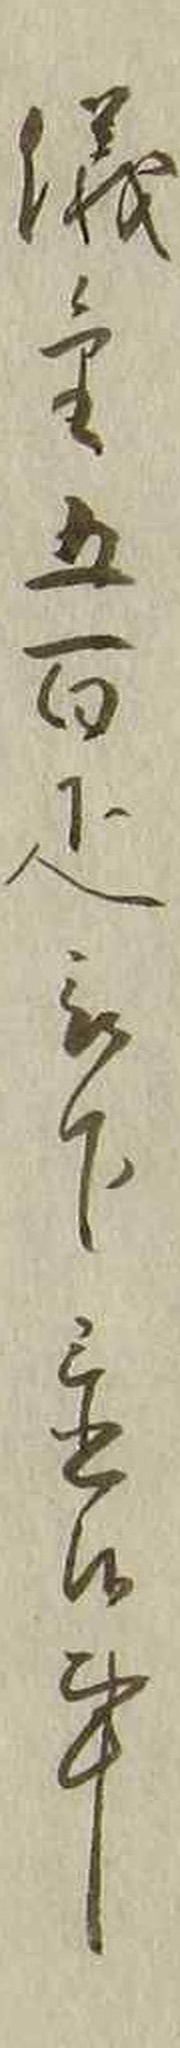儀金五百疋被下置候事
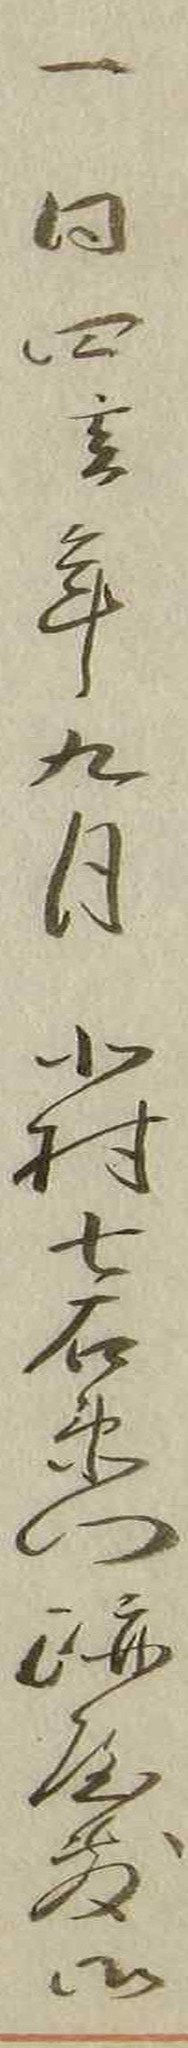一同四亥年九月北村七右衛門跡屋敷御
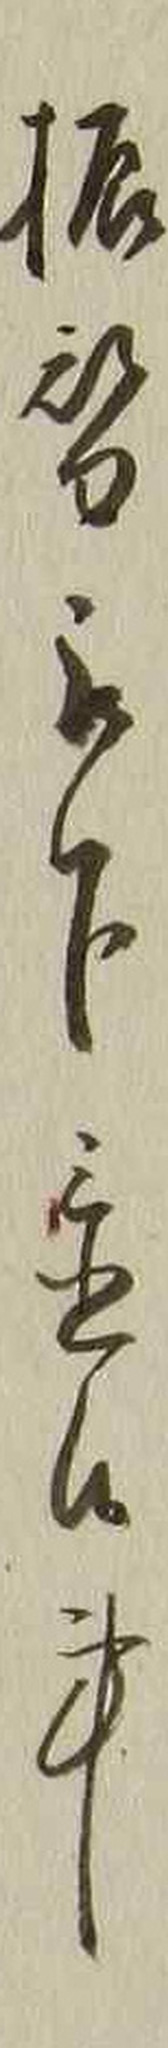振替被下置候事
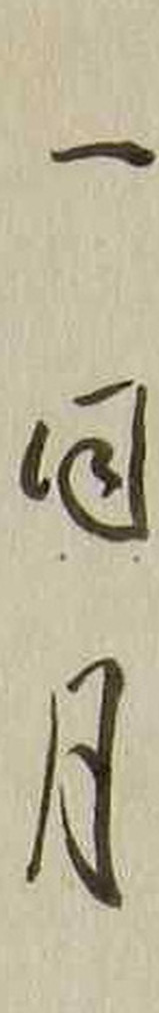一同月
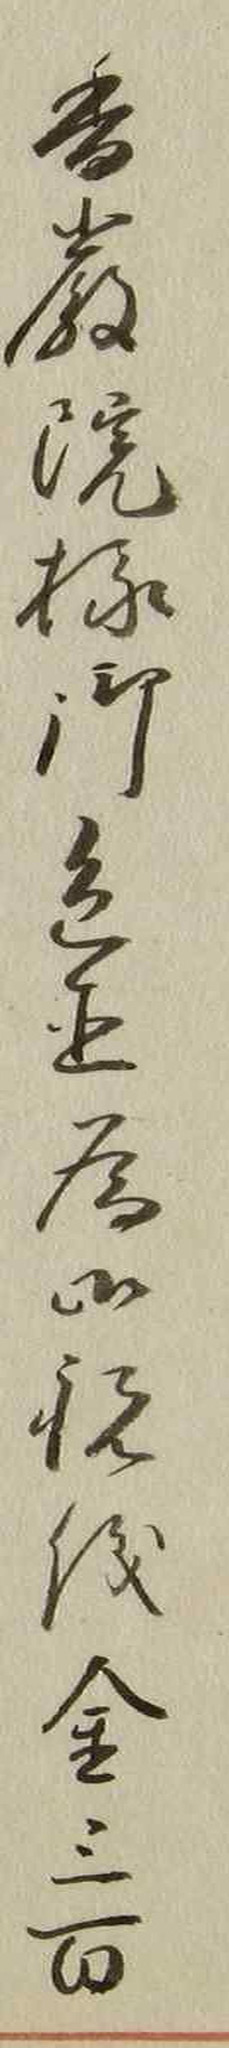香厳院様御色直為御祝儀金三百
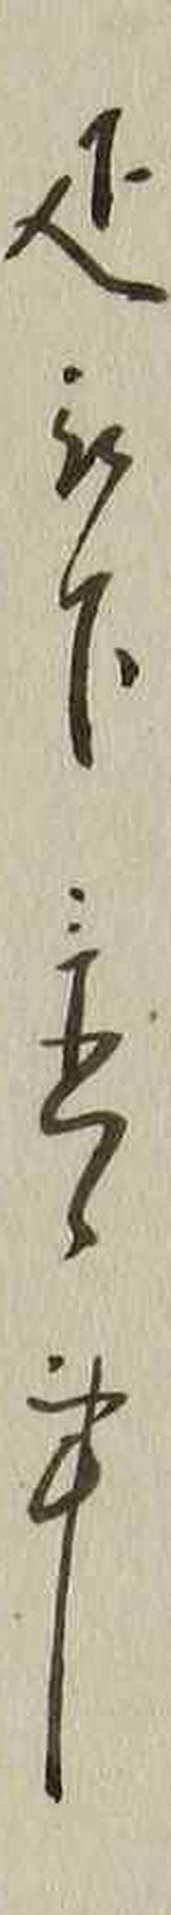疋被下置候事
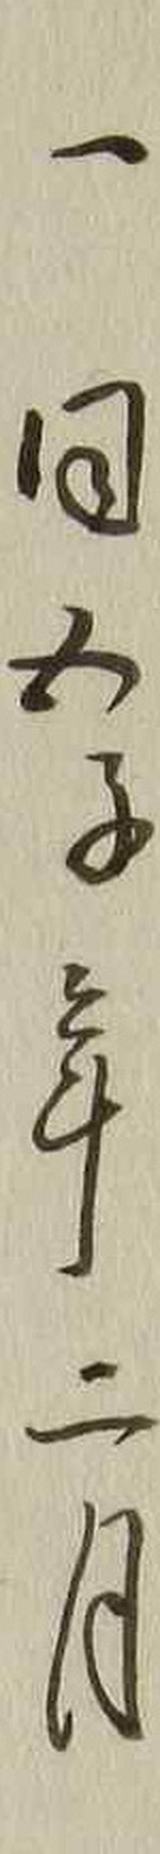一同五子年二月
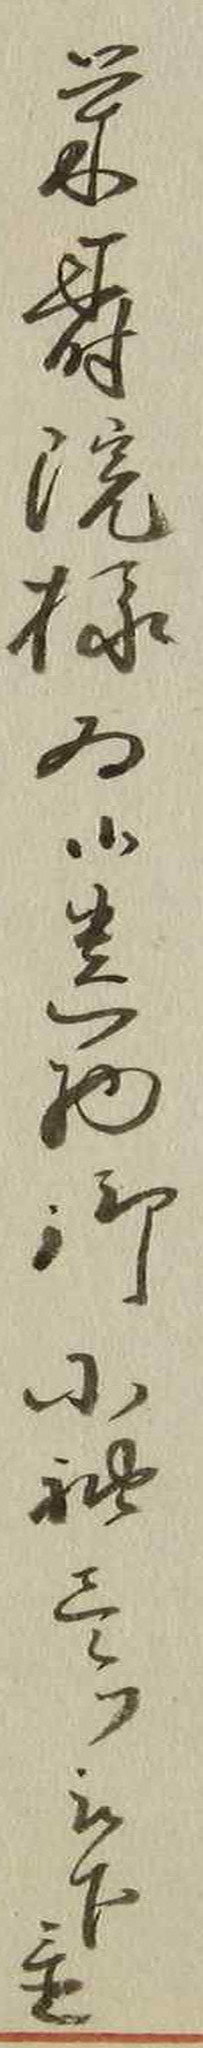栄寿院様為御遺物御小袖壱ツ被下置
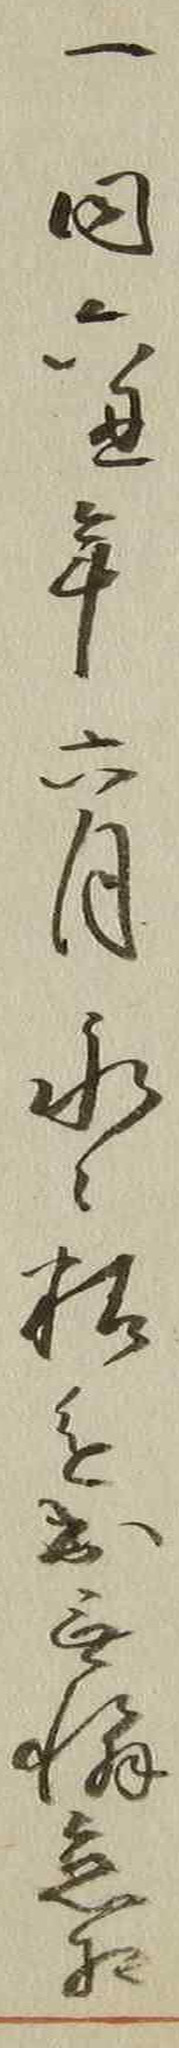一同六丑年六月永々精進出無懈怠相
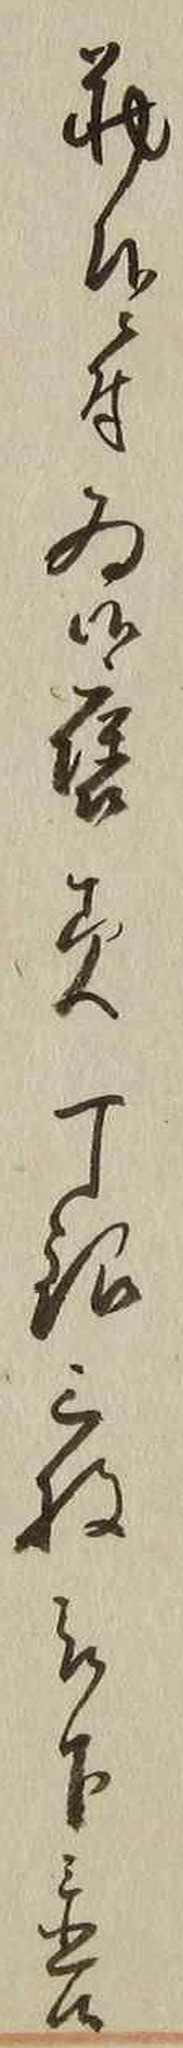勤候ニ付為御褒美丁銀三枚被下置候
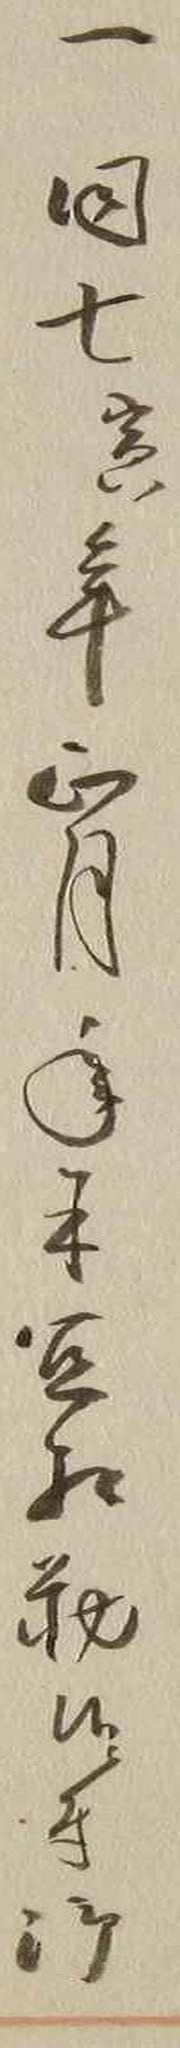一同七寅年正月年来宜相勤候ニ付御
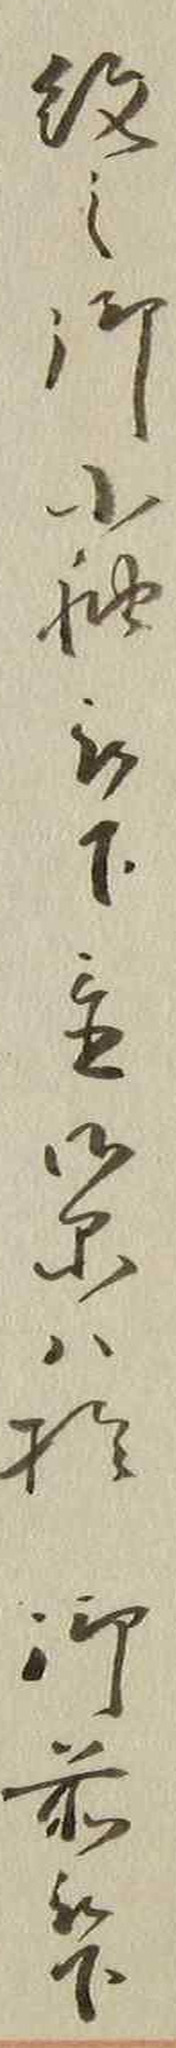紋之御小袖被下置御品ハ於御前被下
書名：諸士系譜　巻之122　よ之部5
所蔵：会津若松市立会津図書館
